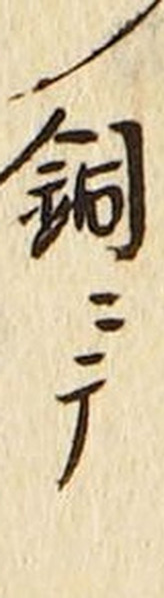銅にて
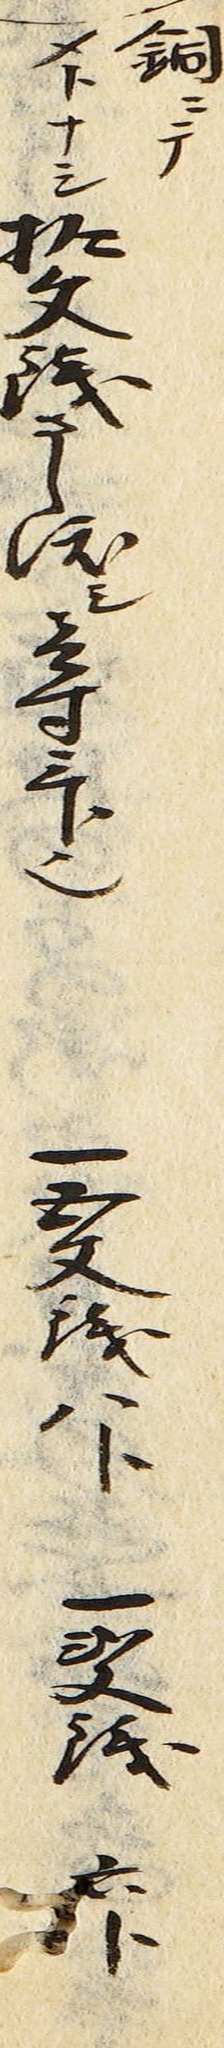銭〆トナシ拾文銭さし渡し壱寸三分也一五文銭八分一弐文銭六分
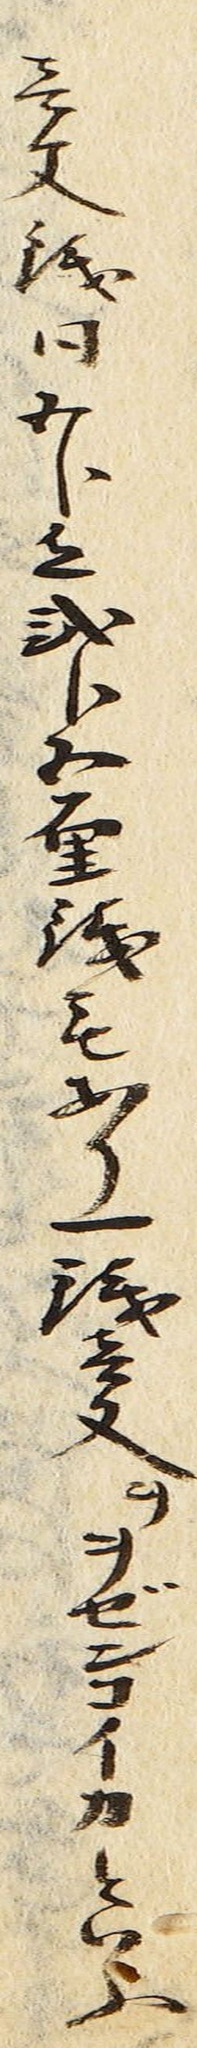壱文銭同五分有弐分五厘銭もあり一銭壱文をヲゼンコイカといふ
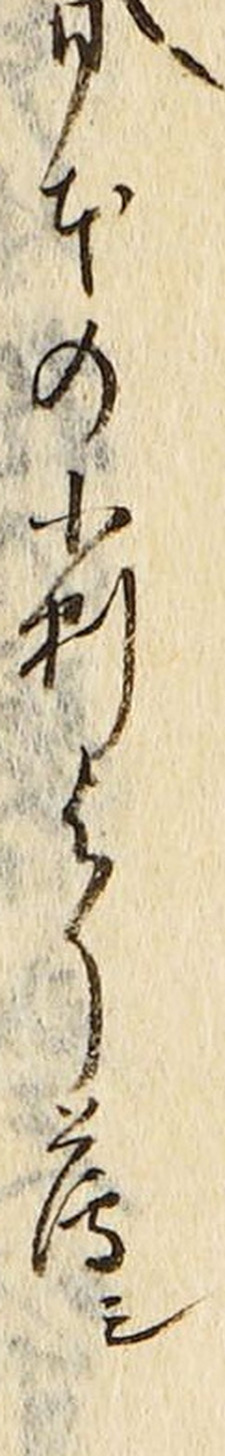日本の小判より薄し
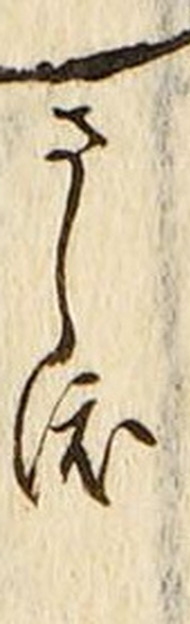さし渡
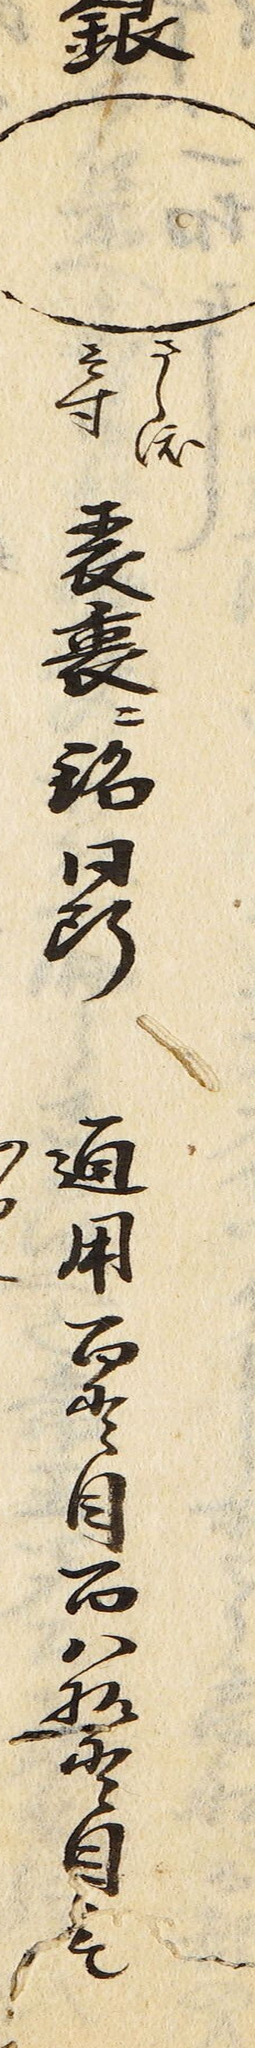銀壱寸表裏に銘同断通用百貫目百八拾貫目も
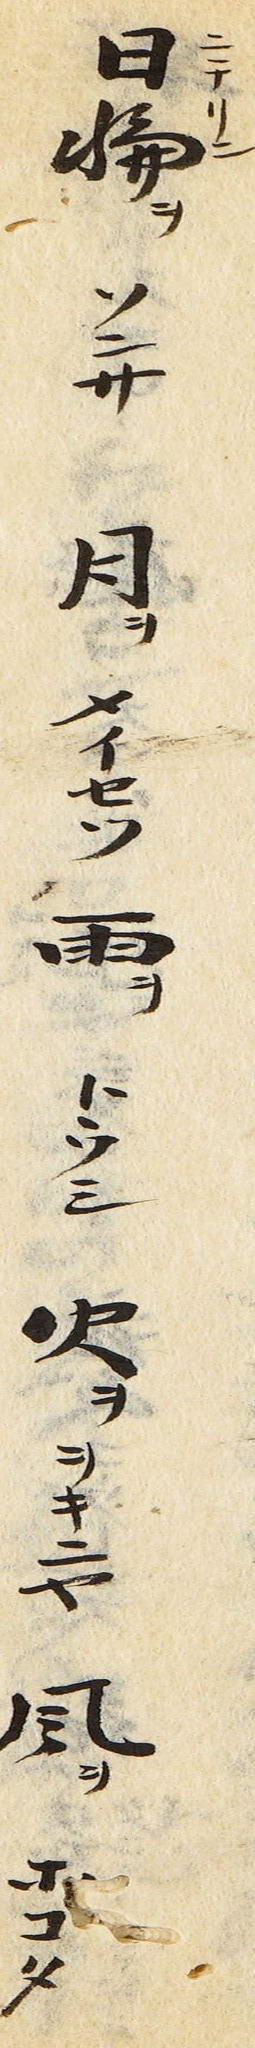日輪をソンサ月をメイセツ雨をトウシ火をヲキンヤ風をホコタ
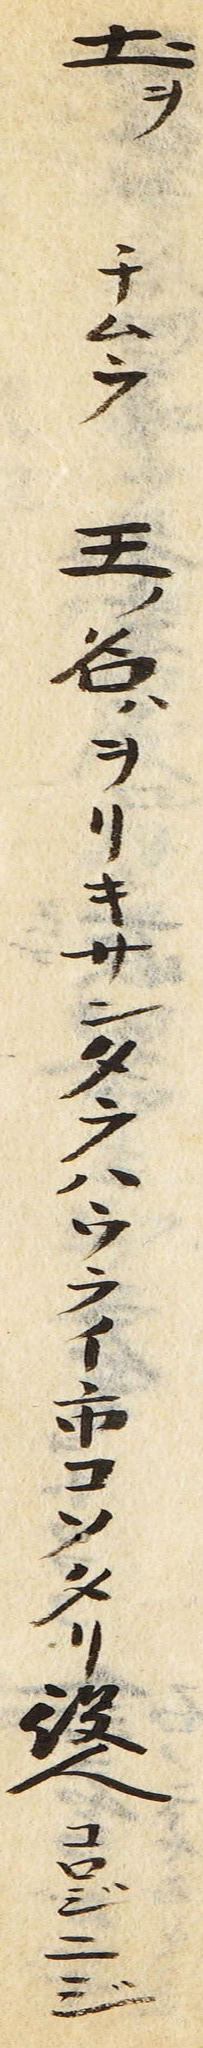土をチムサ王ノ名はヲリキサンタラハウライ市コソタリ役人コロジニ
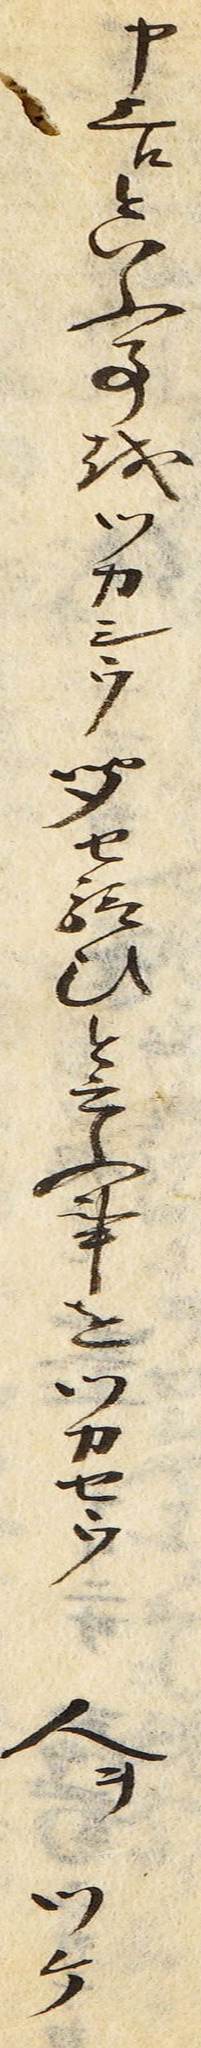申上候といふ事をツカシウ聞せ給ひと云ふ事をツカセウ人をツケ
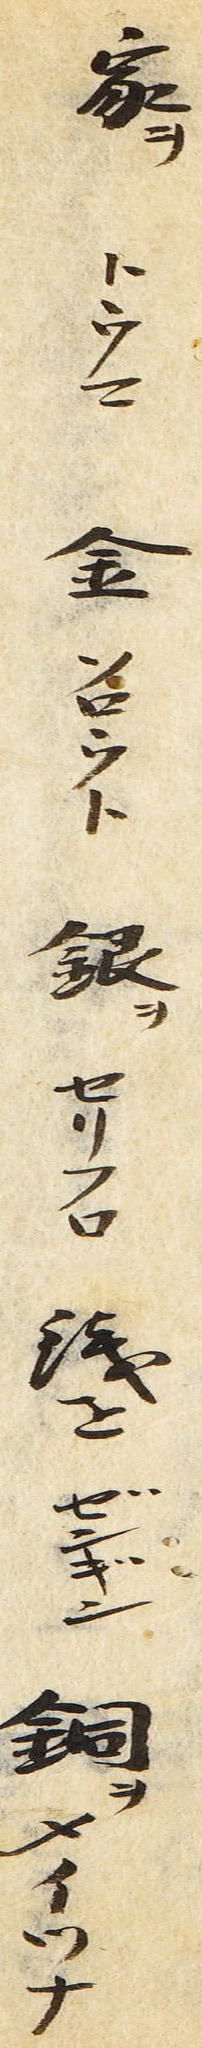家をトウマ金ソロウト銀をセリフロ銭をゼンギン銅をメイツナ
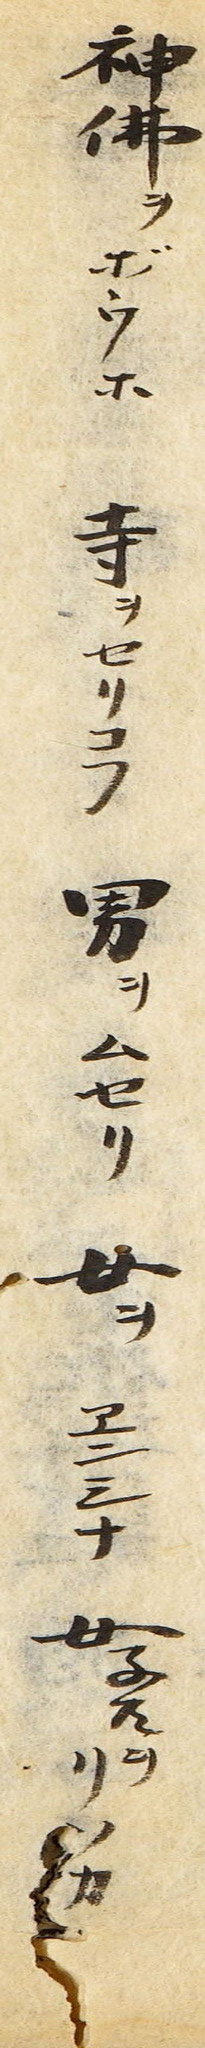神仏をボウホ寺をセリコフ男をムセリ女をエンシナ女子共をリソカ
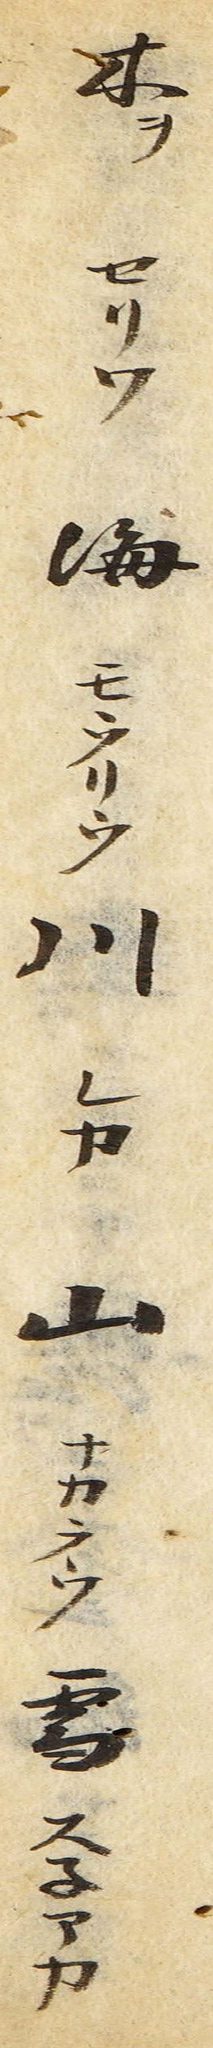木をセリワ海モウリウ川レカ山ナカラウ雪スネアカ

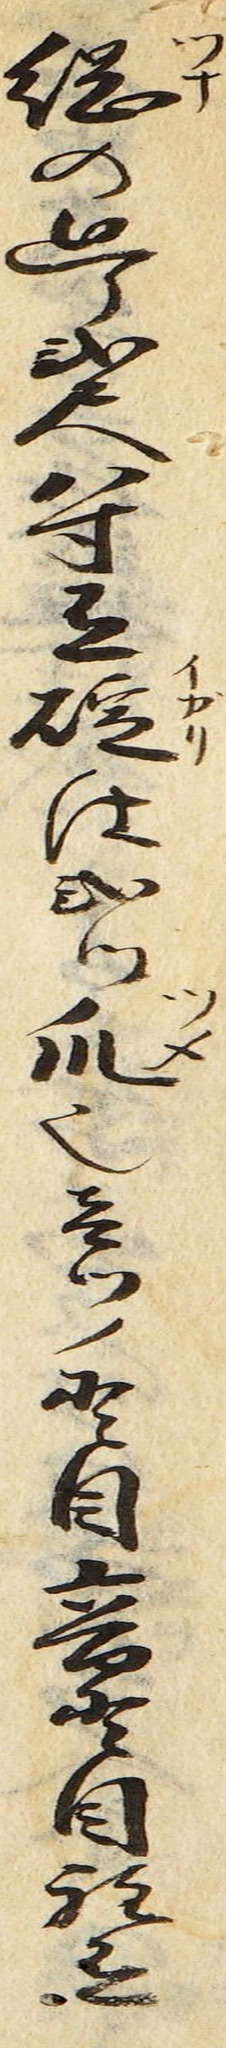綱の廻り弐尺八寸有碇は弐つ爪也壱つノ貫目六百貫目程有
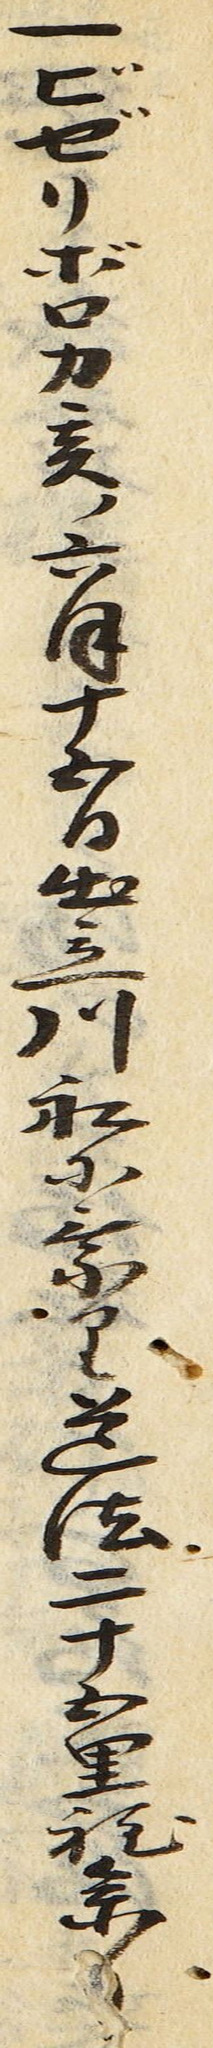一ビゼリボロカ亥ノ六月十五日出立川船に乗り道法二十五里程参り
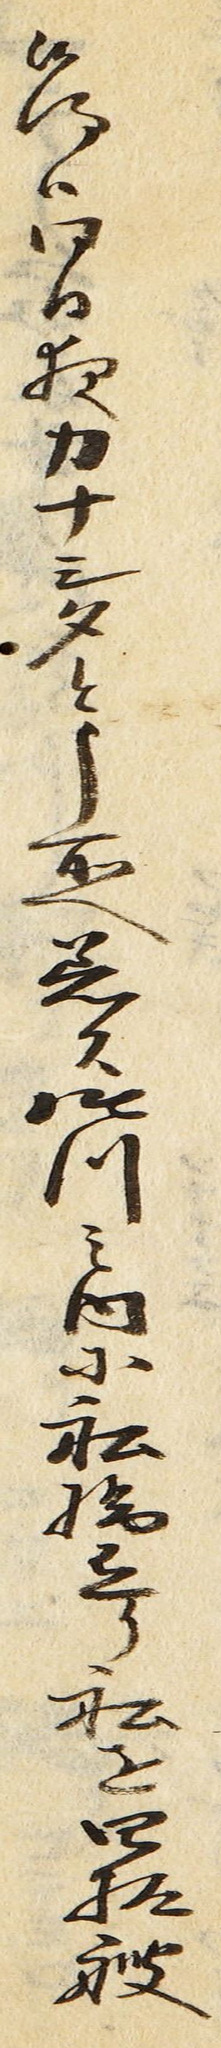候得は同日夜カナシタと申所へ着す此川之内に船場有り船を四拾艘
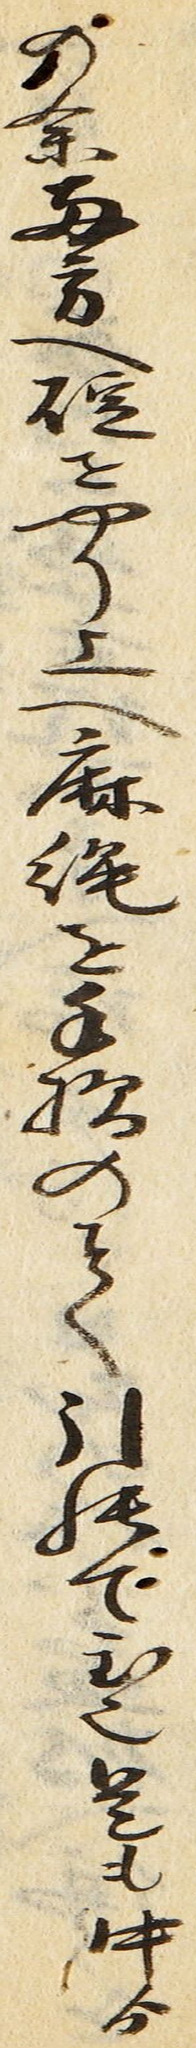の余両方へ碇をやり上へ麻縄を手摺のことく引張て至也是も中ゟ
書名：外国漂流記
